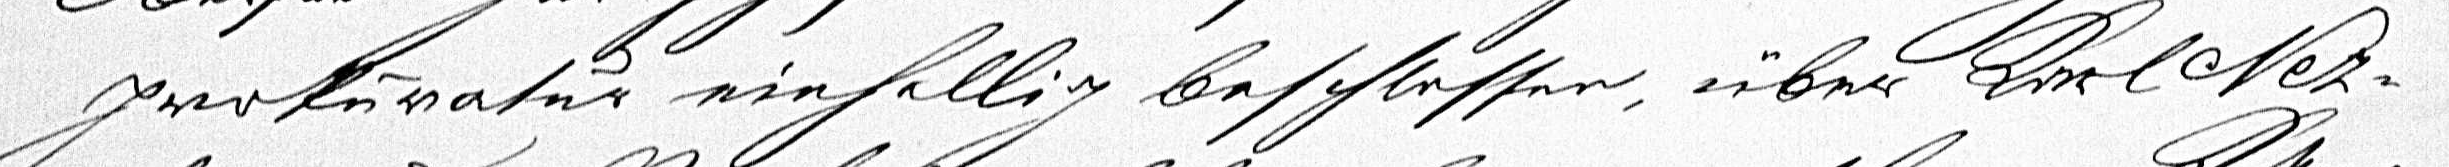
porkuratur einhellig beschlossen, über Karl Nez¬
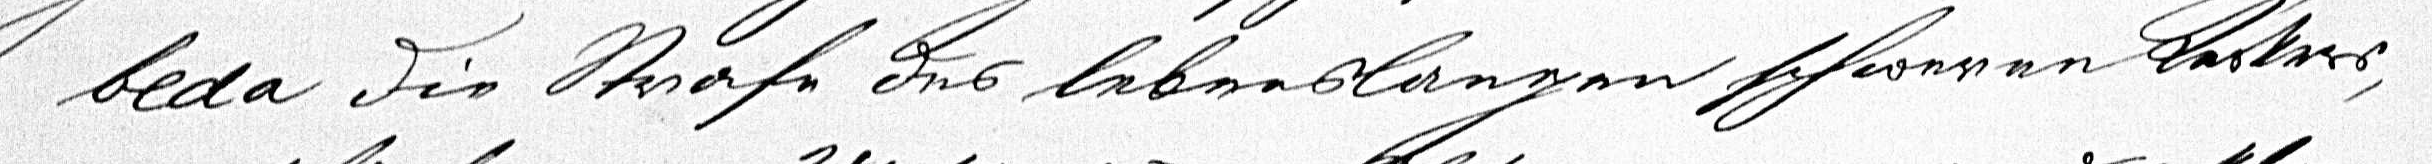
beda die Strafe des lebenslangen schweren Kerkers,
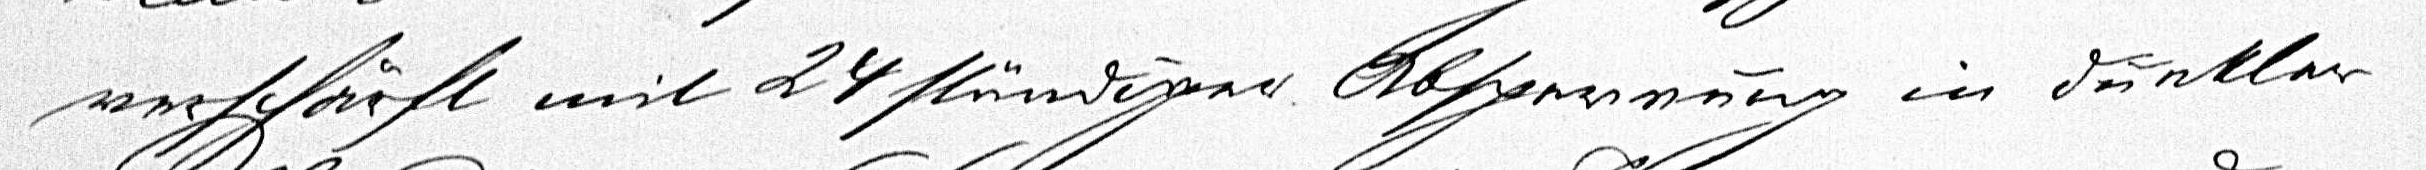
verschärft mit 24stündiger Absperrung in dunkler
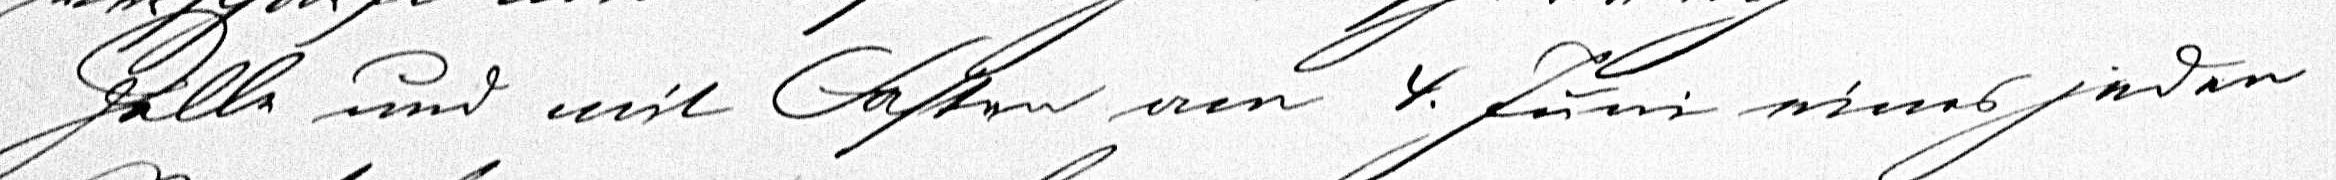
Zelle und mit Fasten am 4. Juni eines jeden
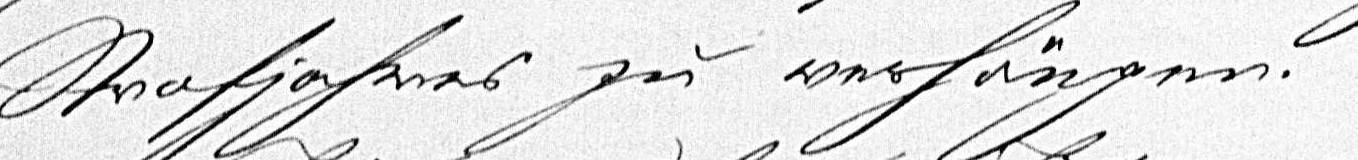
Strafjahres zu verhängen.
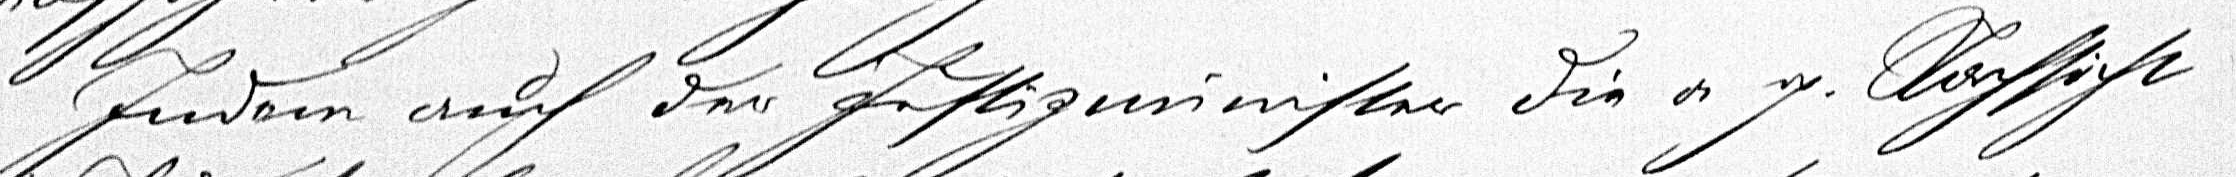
Indem auch der Justizminister die a.g. Nachsicht
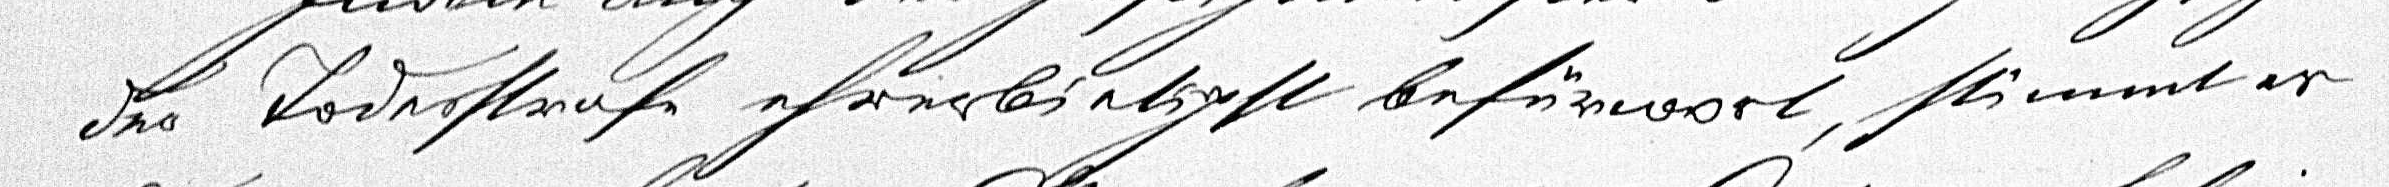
des Todesstrafe ehrerbietigst befürwort, stimmt er
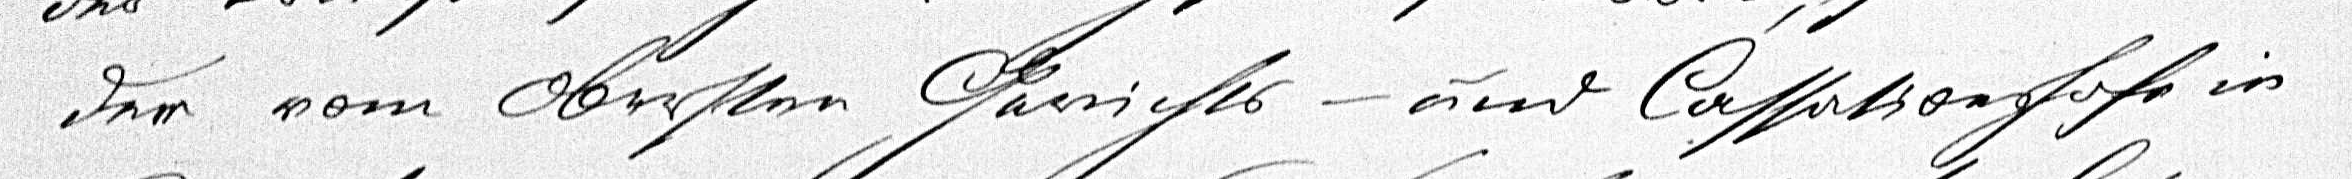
der vom Obersten Gerichts- und Cassationshofe in
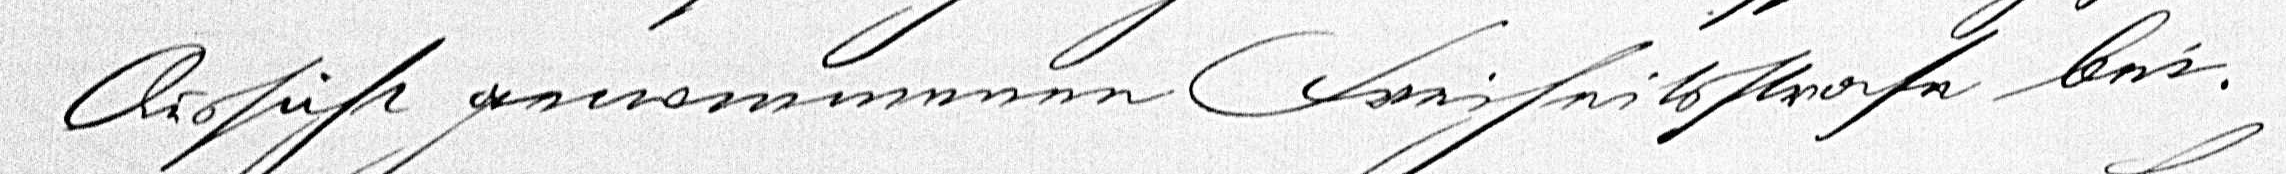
Aussicht genommenen Freiheitsstrafe bei.
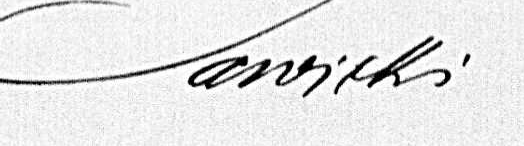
Sawicki
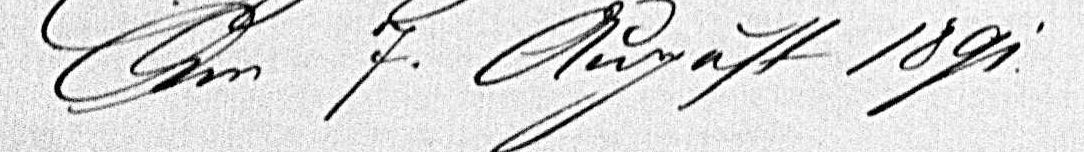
Am 7. August 1891
